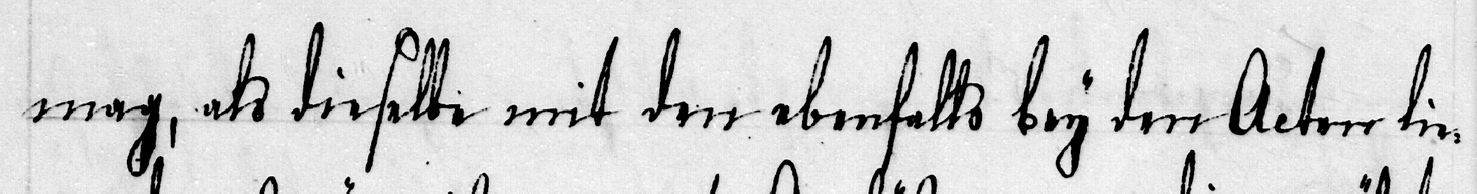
mag, als dieselbe mit den ebenfalls bey den Acten lie¬
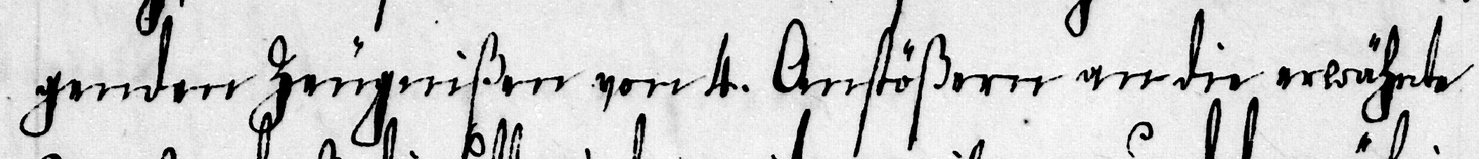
genden Zeugnißen von 4. Anstößern an die erwähnte
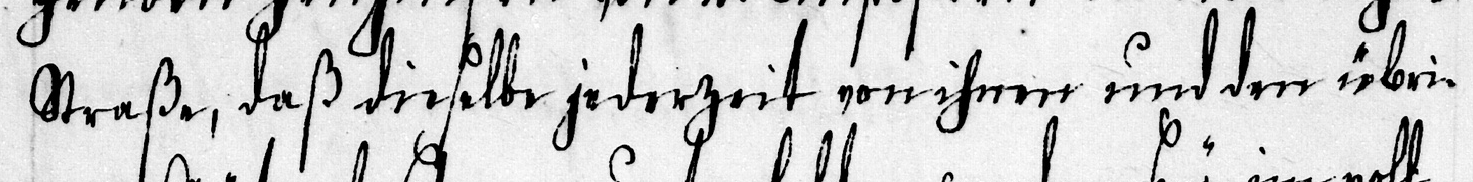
Straße, daß dieselbe jederzeit von ihnen und den übri¬
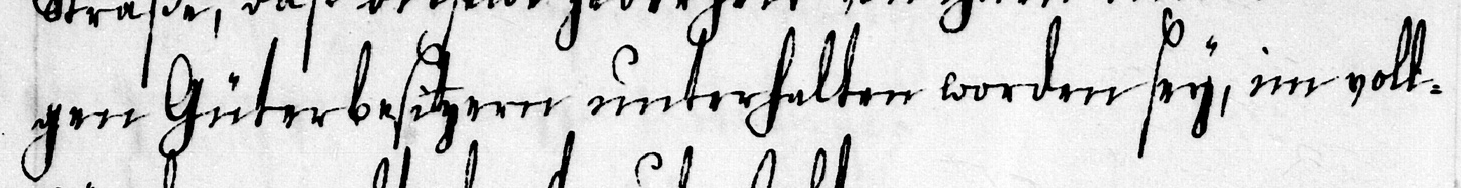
gen Güterbesitzern unterhalten worden sey, im voll¬
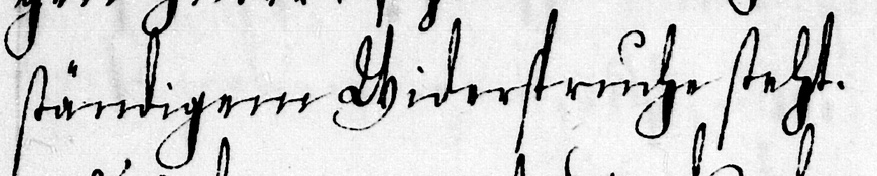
ständigem Widerspruche steht.
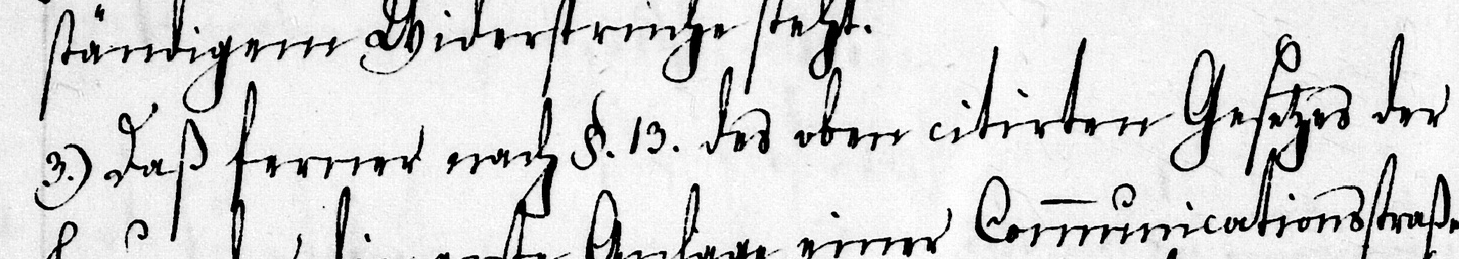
3.) Daß ferner nach §. 13. des oben citirten Gesetzes der
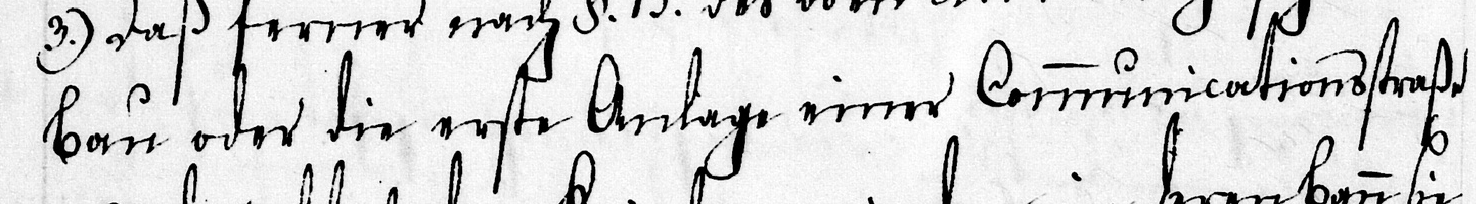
Bau oder die erste Anlage einer Communicationsstraße
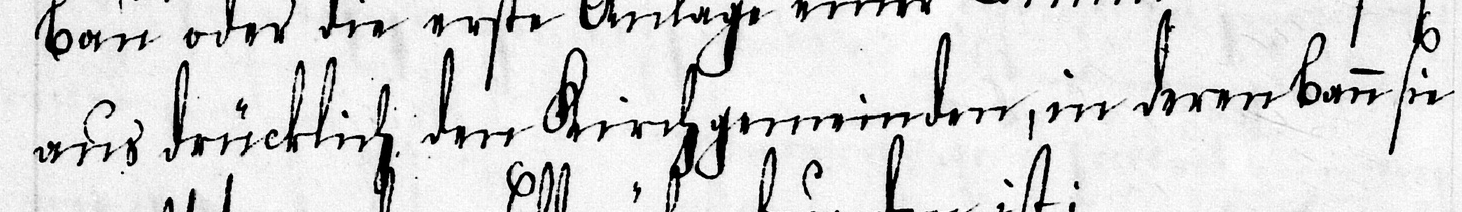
ausdrücklich den Kirchgemeinden, in deren Bann s¬
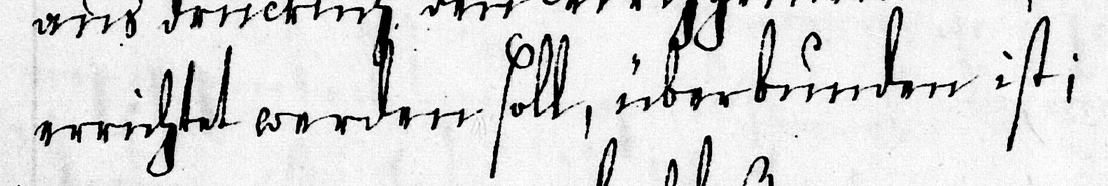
errichtet werden soll, überbunden ist;
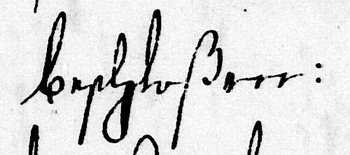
beschloßen:
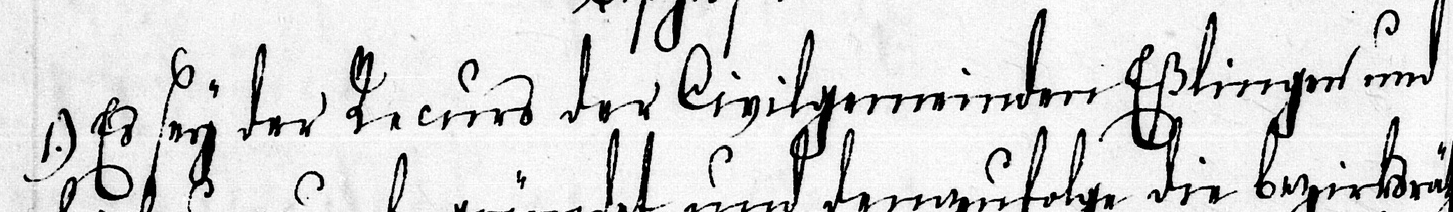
1.) Es sey der Recurs der Civilgemeinden Eßlingen und
